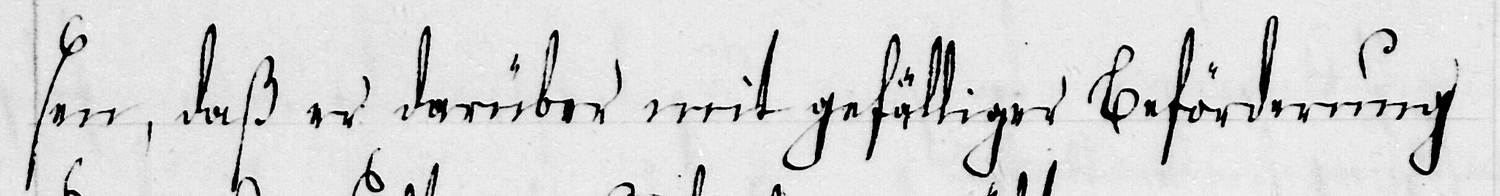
sen, daß er darüber mit gefälliger Beförderung
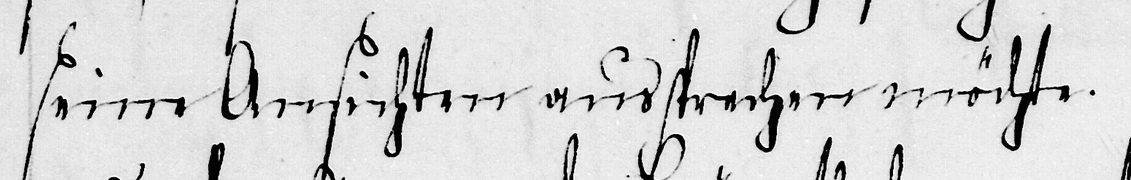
seine Ansichten aussprechen möchte.
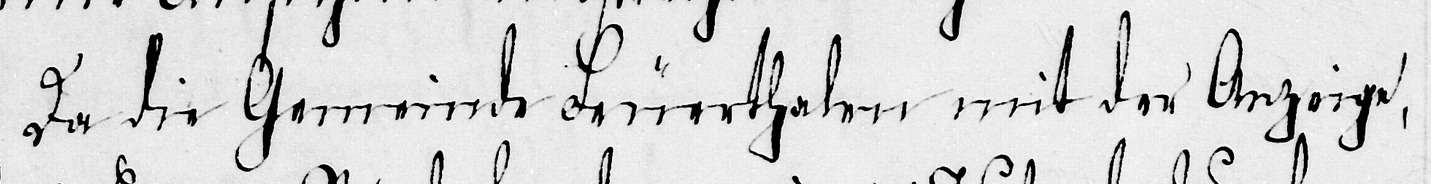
Da die Gemeinde Feuerthalen mit der Anzeige,
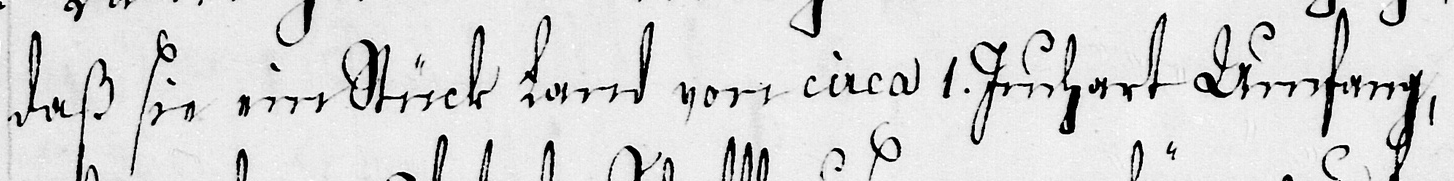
daß sie ein Stück Land von circa 1. Juchart Umfang,
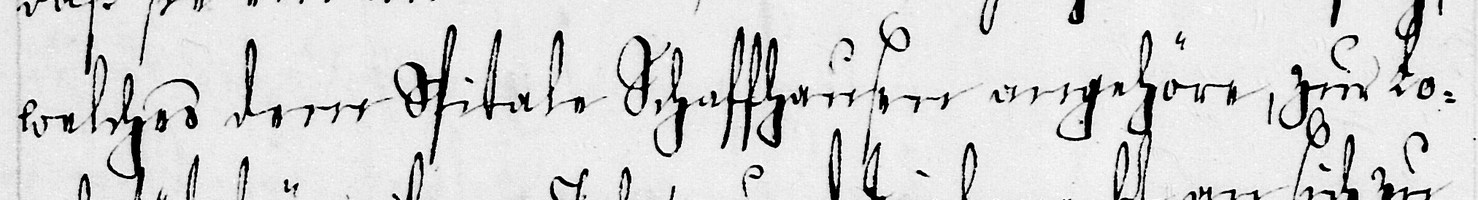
welches dem Spitale Schaffhausen angehöre, zur Lo¬
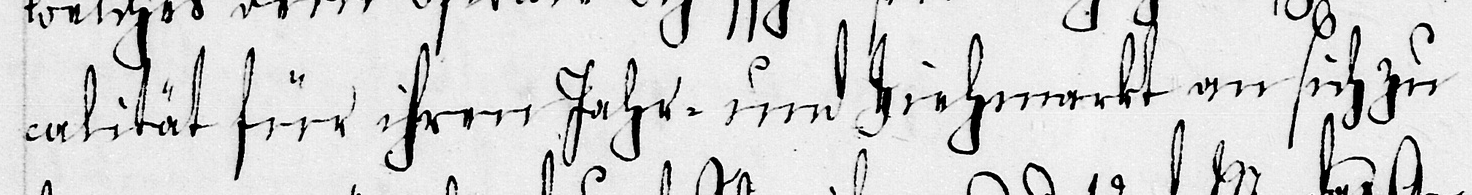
calität für ihren Jahr- und Viehmarkt an sich zu
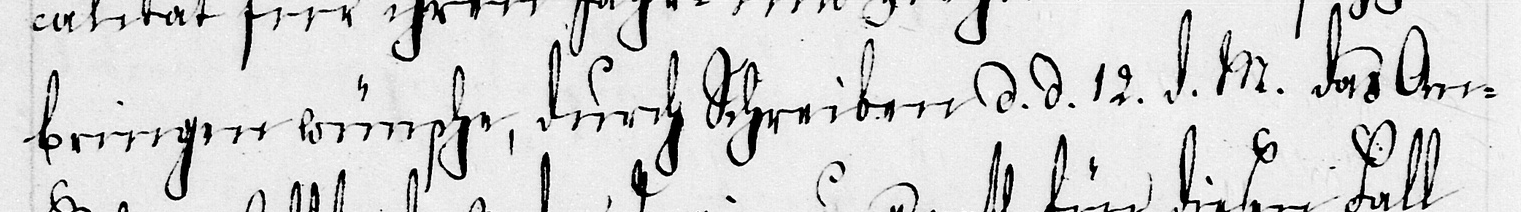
bringen wünsche, durch Schreiben d. d. 12. d. M. das An¬
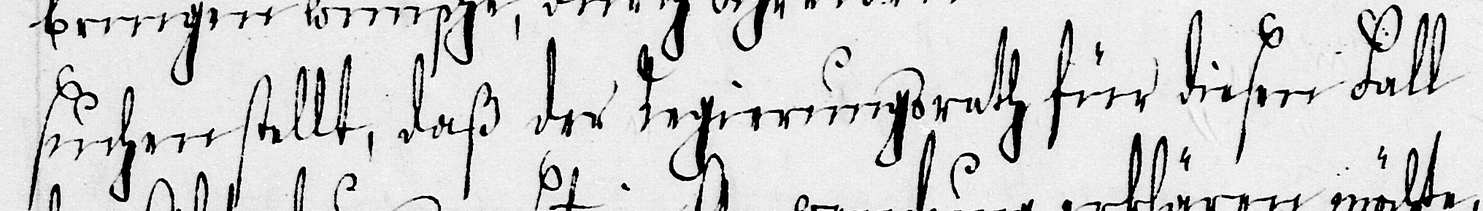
suchen stellt, daß der Regierungsrath für diesen Fall
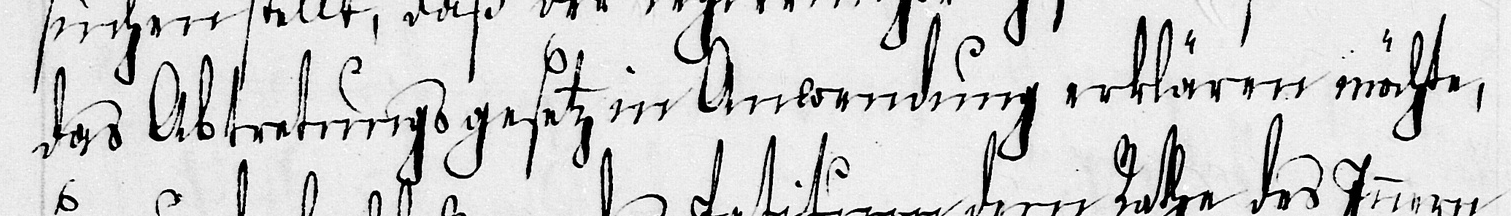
das Abtretungsgesetz in Anwendung erklären möchte,
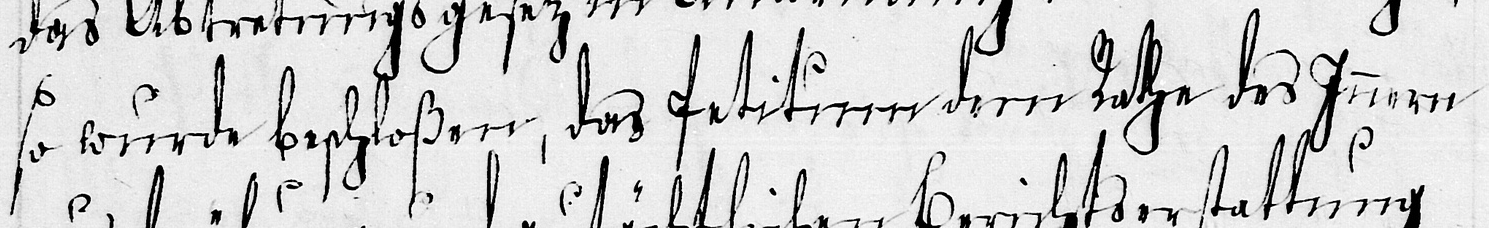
so wurde beschloßen, das Petitum dem Rathe des Innern
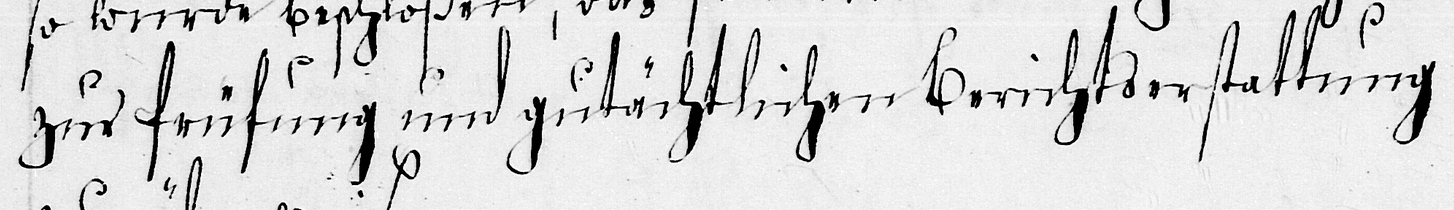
zur Prüfung und gutächtlichen Berichtserstattung
